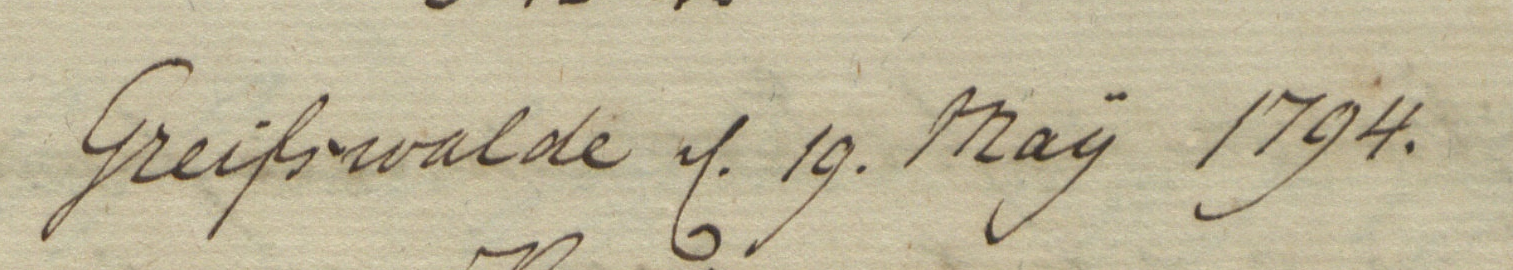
Greifswalde d. 19. May 1794.
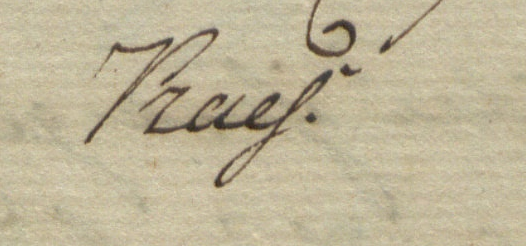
Praes.
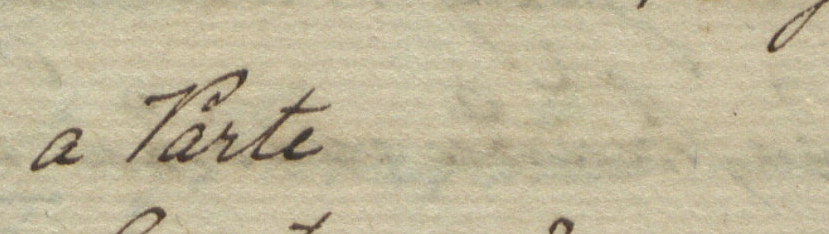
a Parte
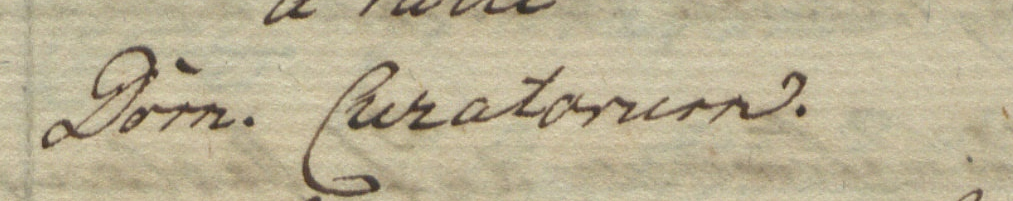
Dom. Curatorum.
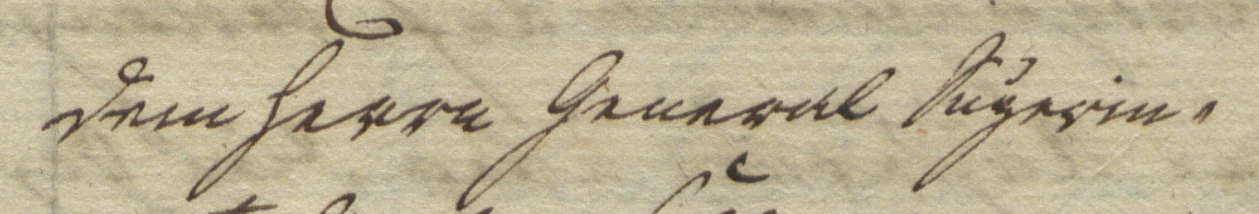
dem Herrn General Superin¬
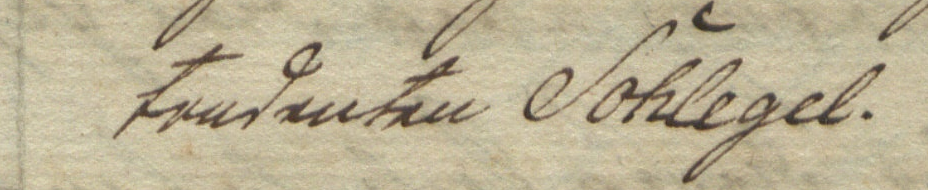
tendenten Schlegel.
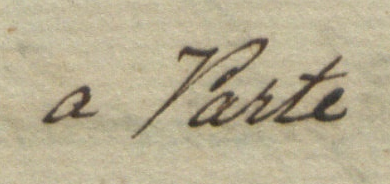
a Parte
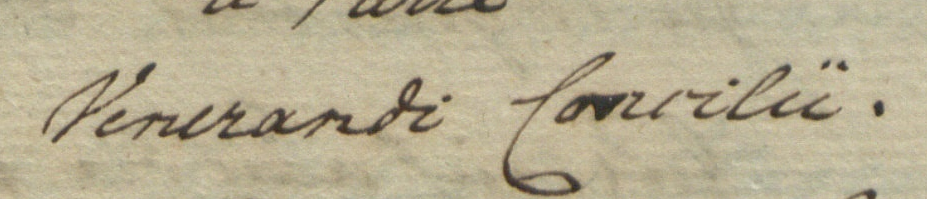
Venerandi Concilii
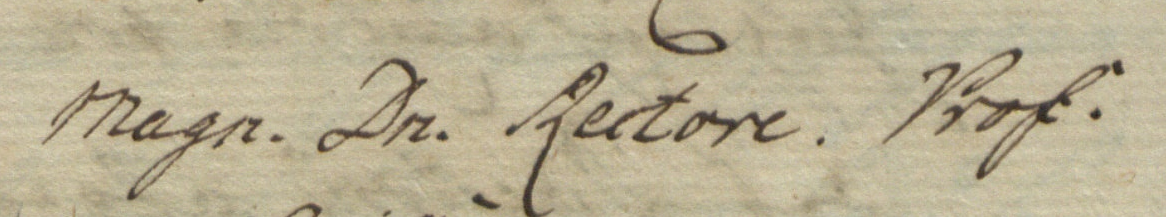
Magn. Dn. Rectore. Prof.
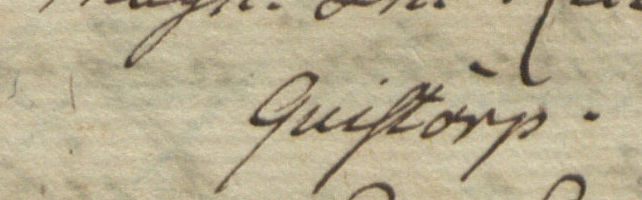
Quistorp
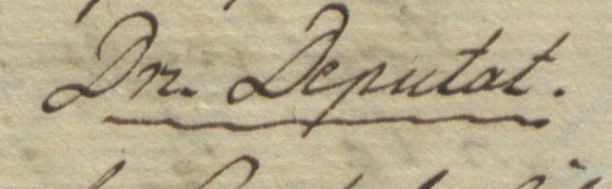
Dn. Deputat.
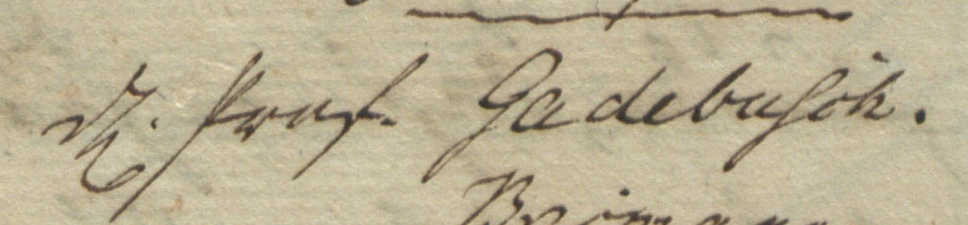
dh. Prof. Gadebusch
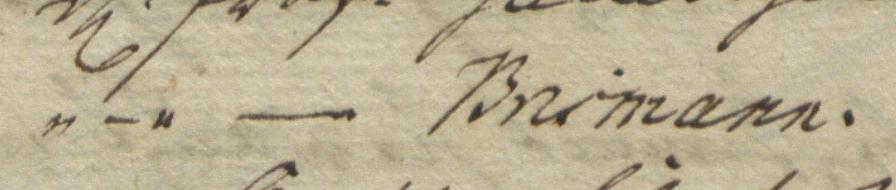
" - " - Brismann
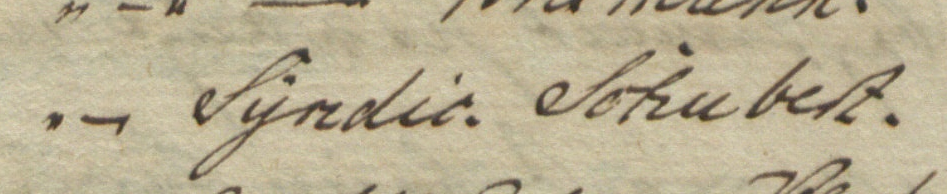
" - Syndic. Schubert.
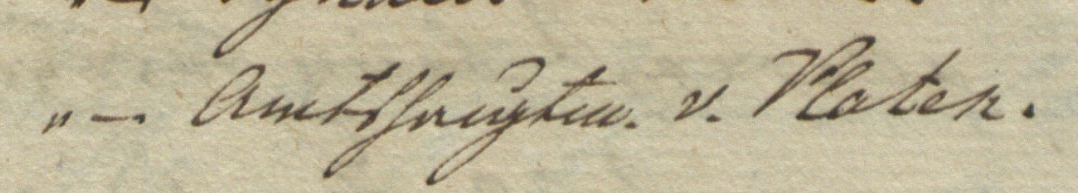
" - Amtshauptm. v. Platen
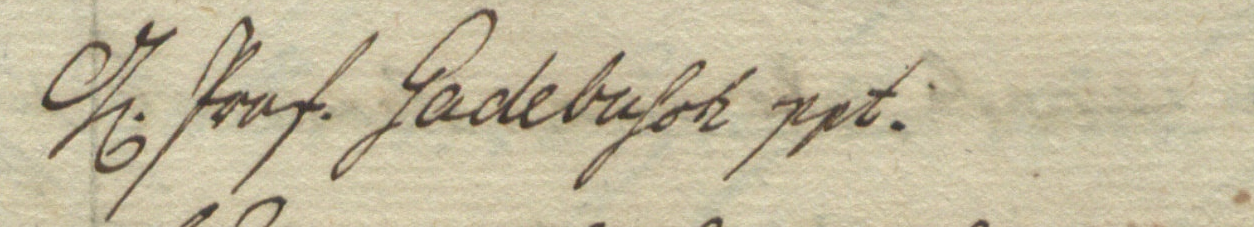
dh. Prof. Gadebusch ppt.
